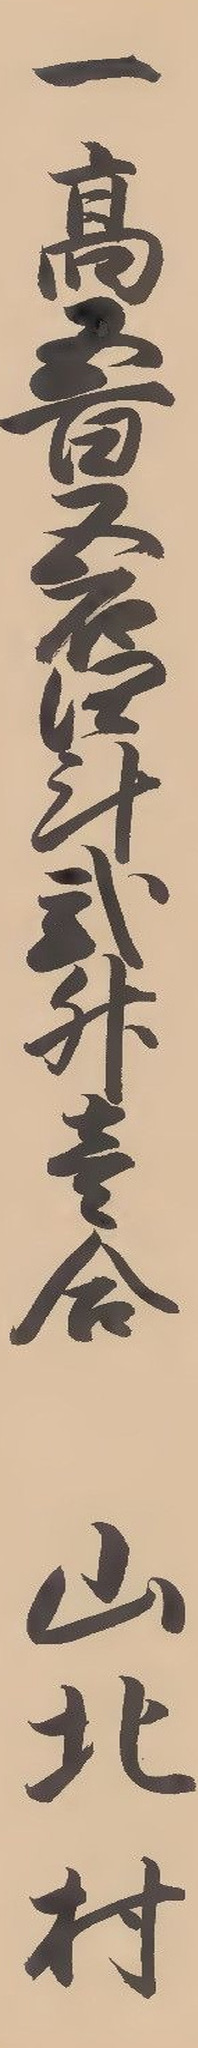一高五百五石四斗弐升壱合山北村
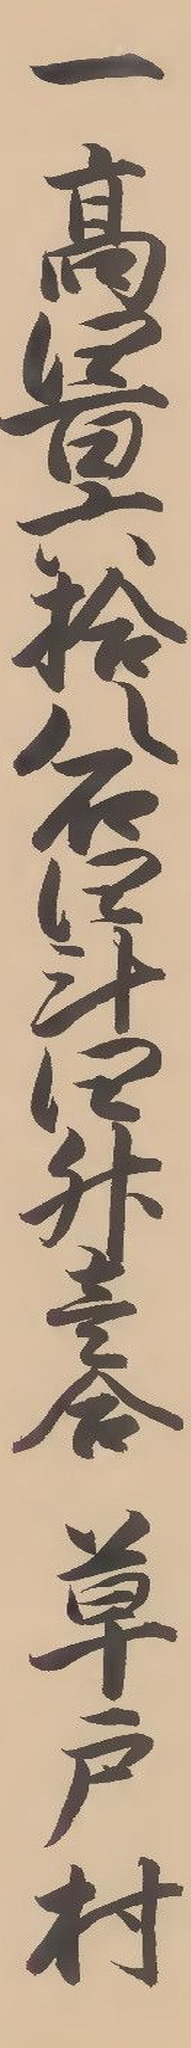一高四百六拾八石四斗四升壱合草戸村
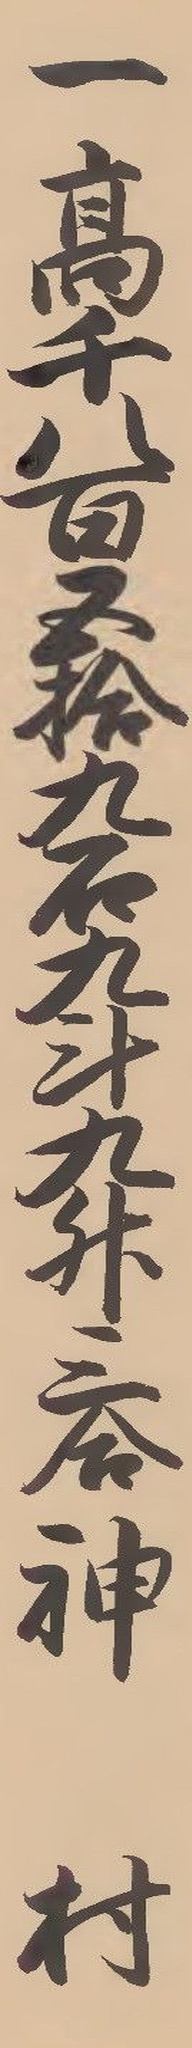一高千八百五拾九石九斗九升三合神村
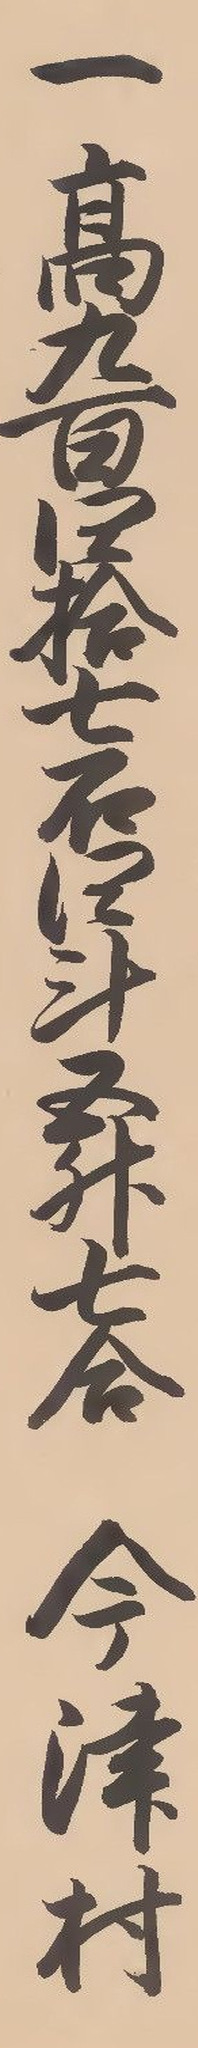一高九百四拾七石四斗五升七合今津村
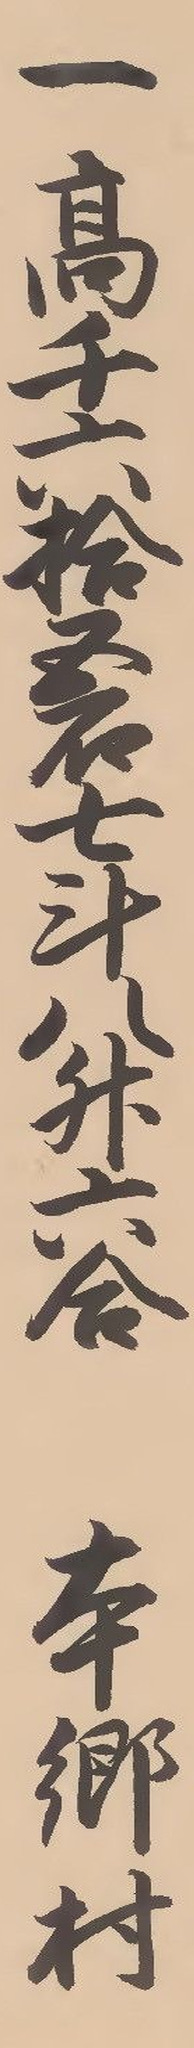一高千六拾五石七斗八升六合本郷村
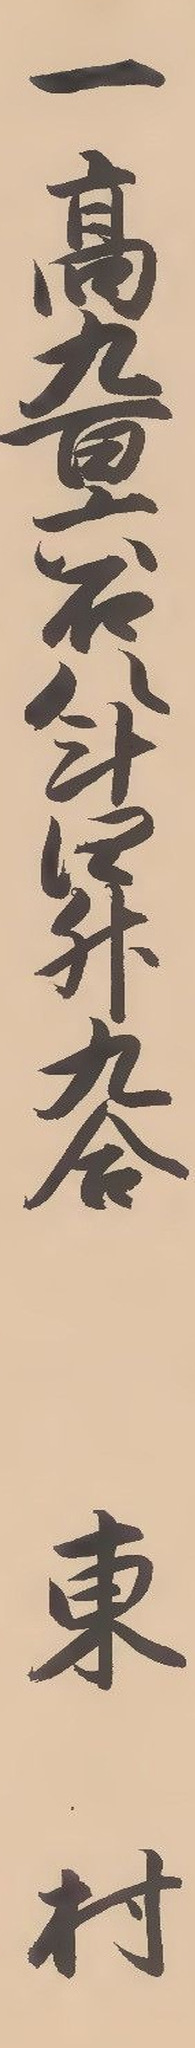一高九百六石八斗四升九合東村
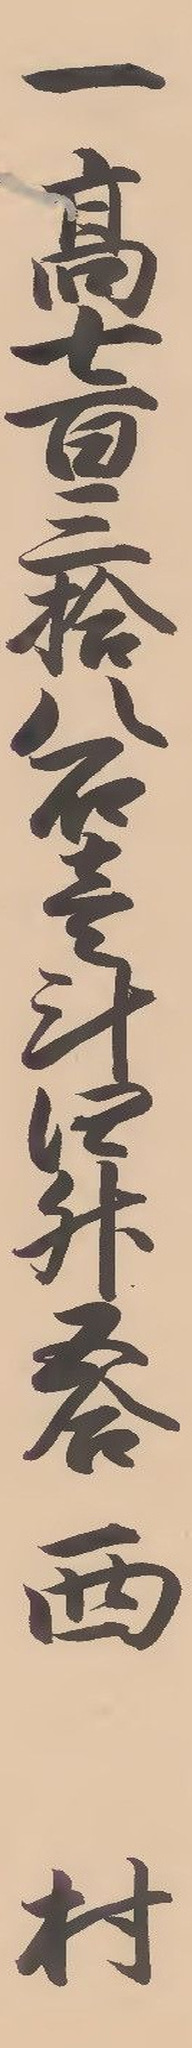一高七百三拾八石壱斗四升五合西村

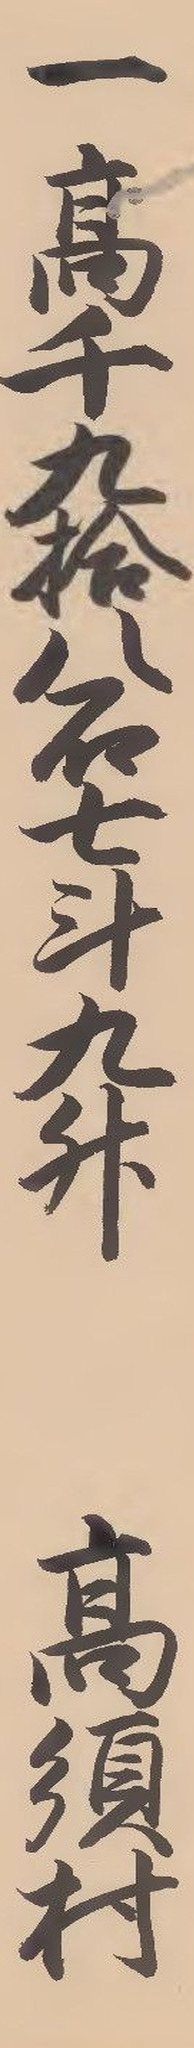一高千九拾八石七斗九升高須村
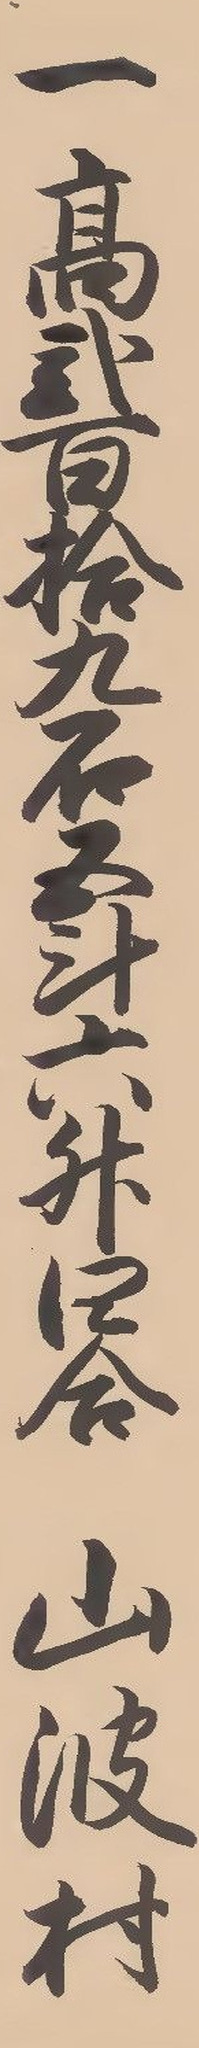一高弐百拾九石五斗六升四合山波村
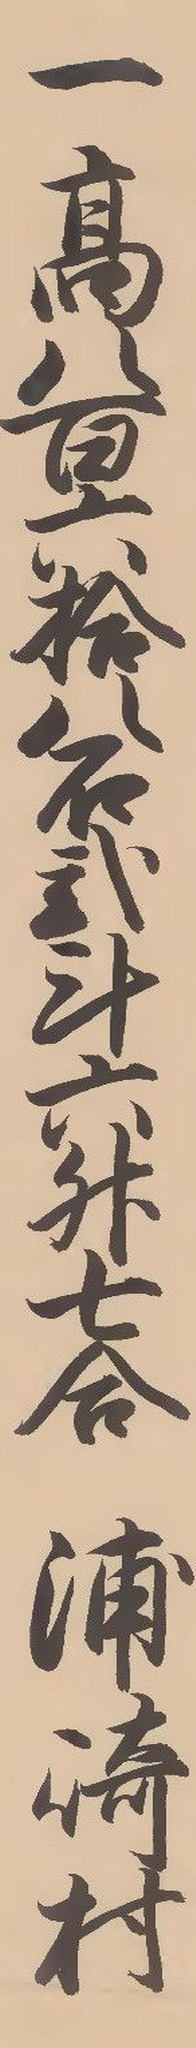一高八百六拾八石弐斗六升七合浦崎村
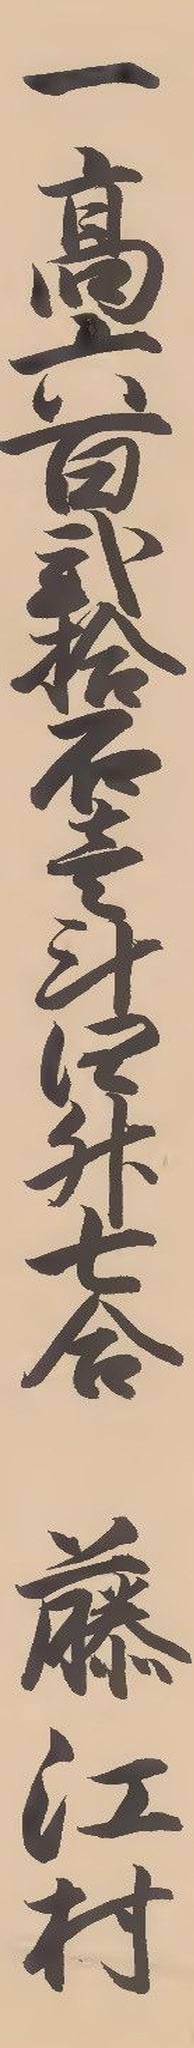一高六百弐拾石壱斗四升七合藤江村
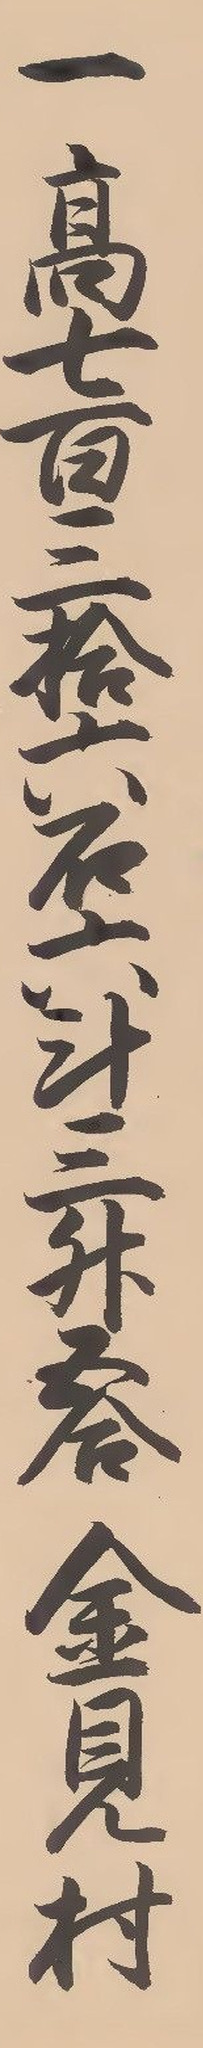一高七百三拾六石六斗三升五合金見村
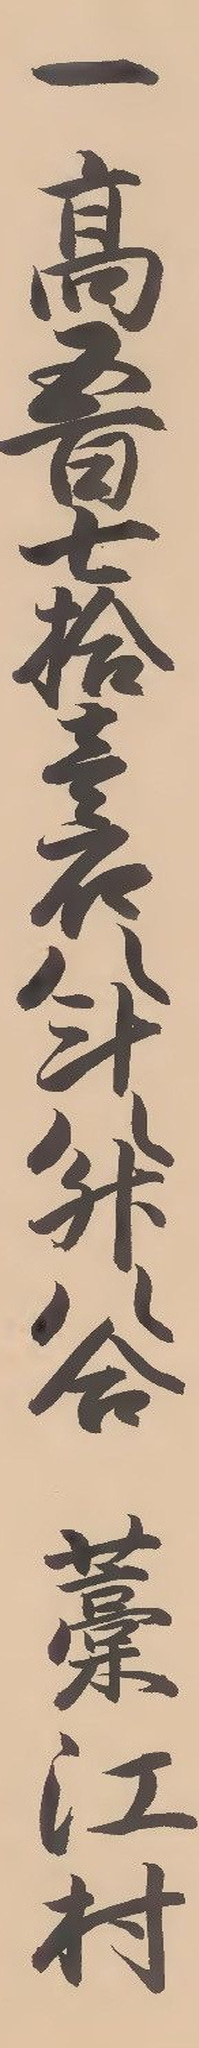一高五百七拾壱石八斗八升八合藁江村
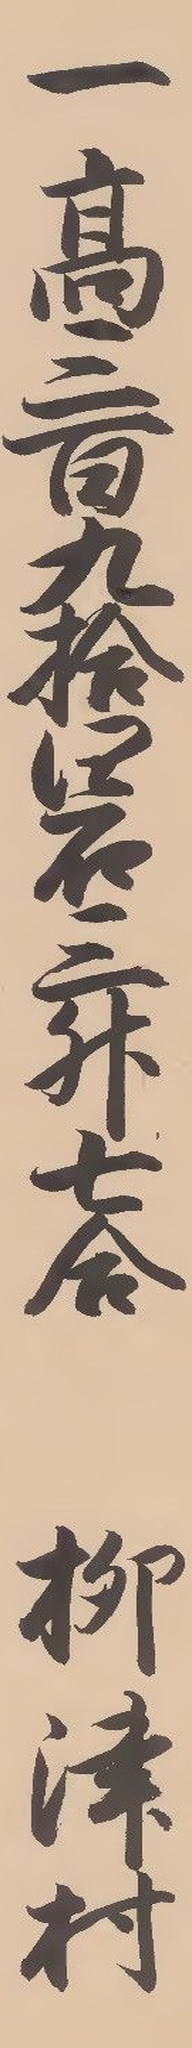一高三百九拾四石三升七合柳津村
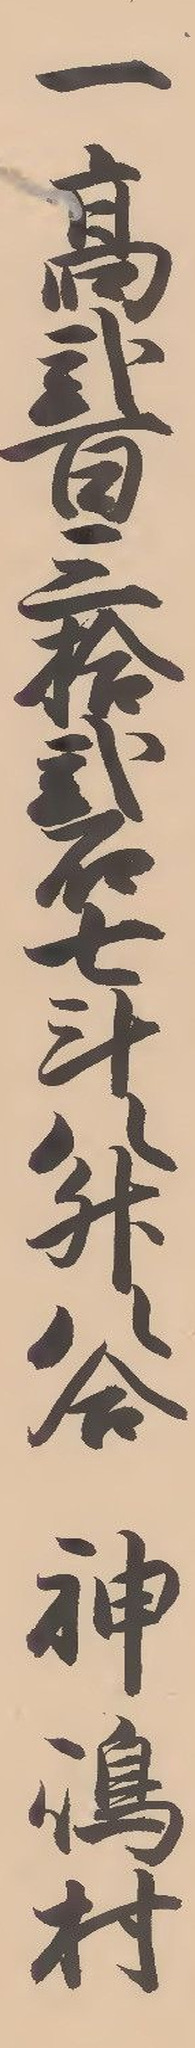一高弐百三拾弐石七斗八升八合神島村

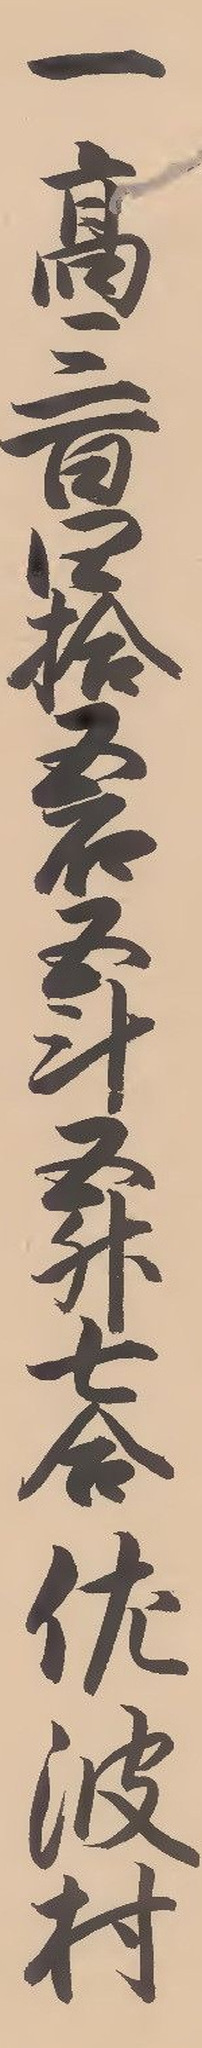一高三百四拾五石五斗五升七合佐波村
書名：備後国郷帳
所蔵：国立公文書館 National Archives of Japan
